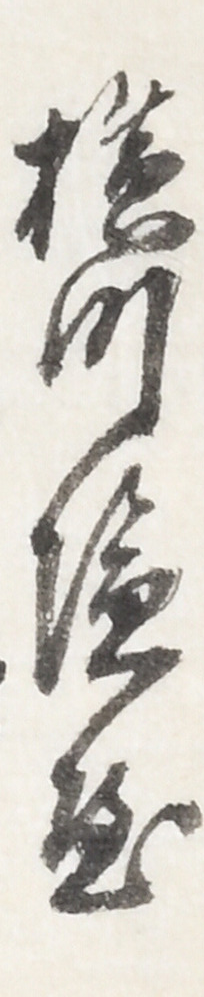横町塩屋
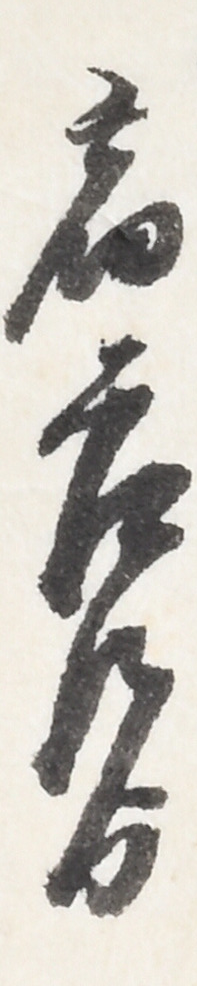宿吉左衛門
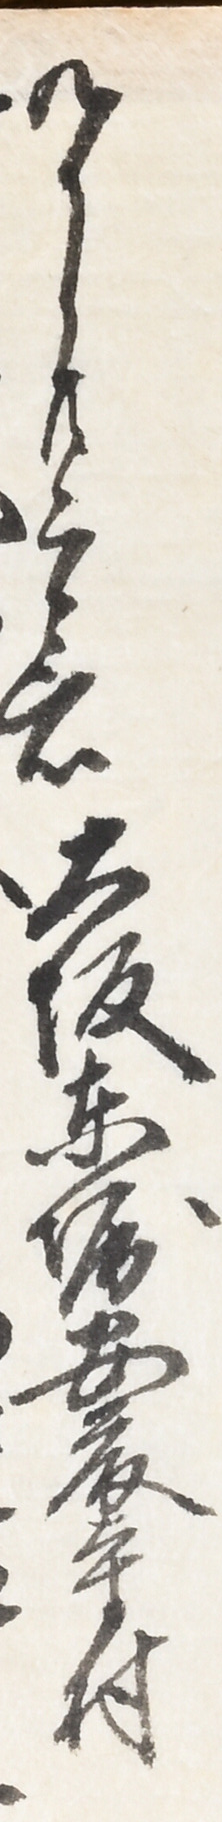九月廿二日着大坂東堀安藤寺村
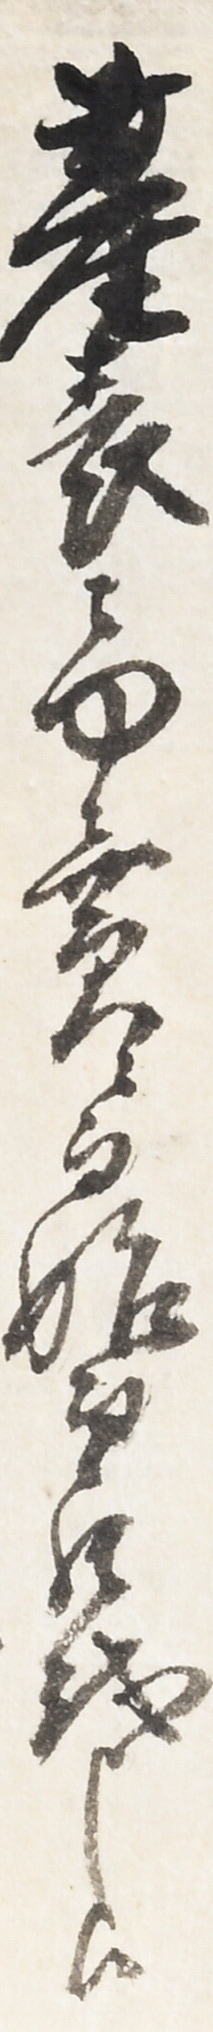表商売ニ而始而罷越申候
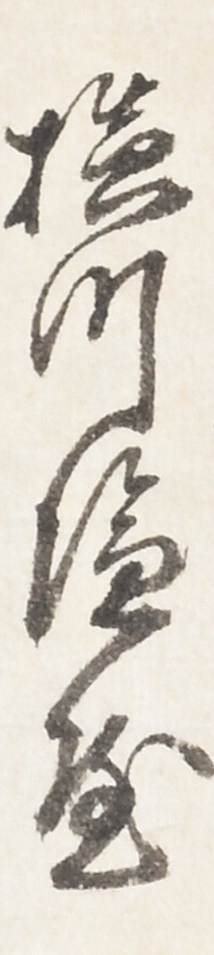横町塩屋
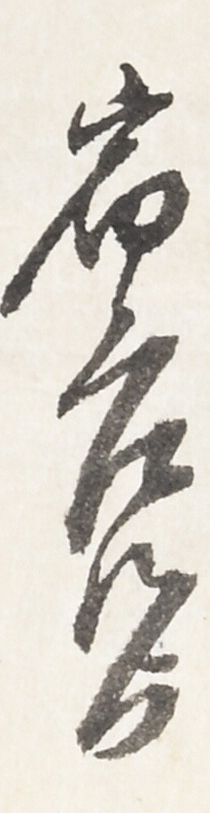宿吉左衛門
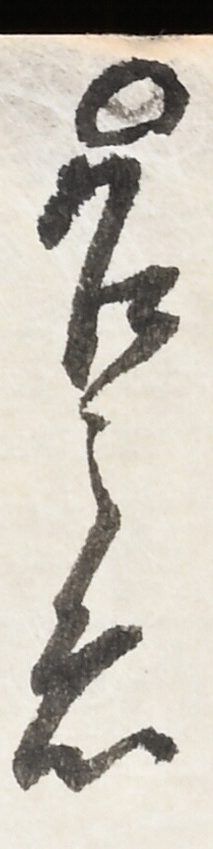〇右之者
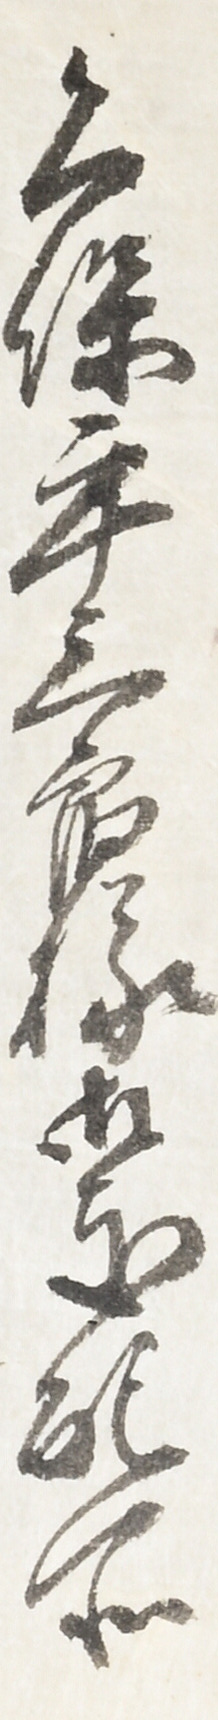久保平三郎様御支配所
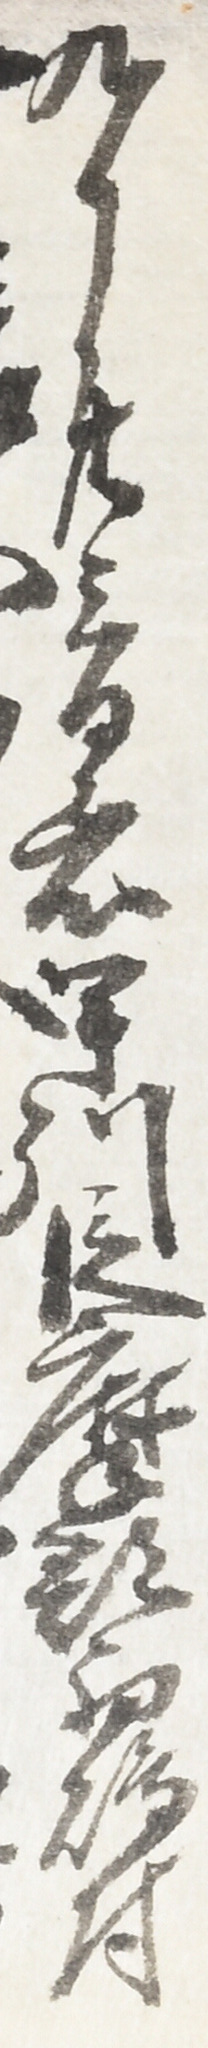九月廿三日着甲州巨摩郡西嶋村
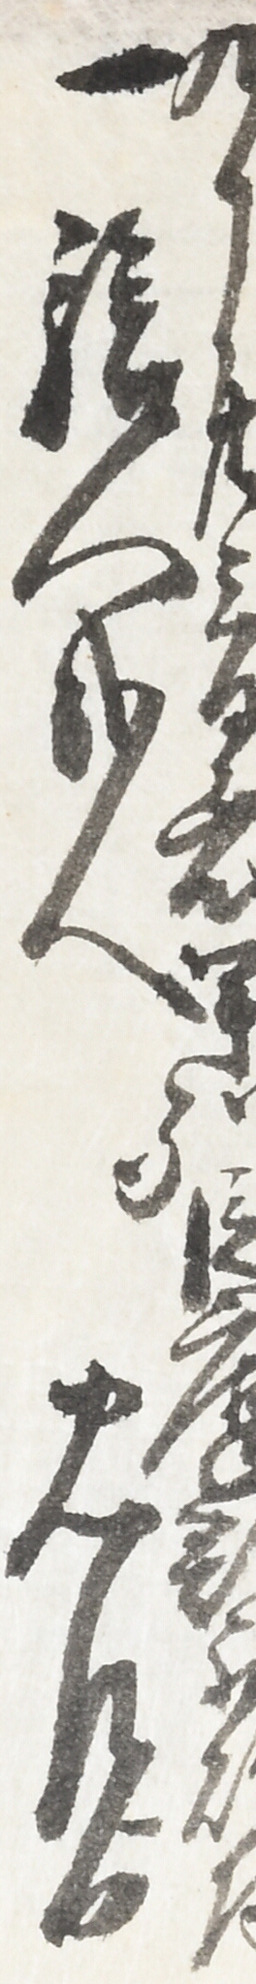一旅人弐人忠左衛門
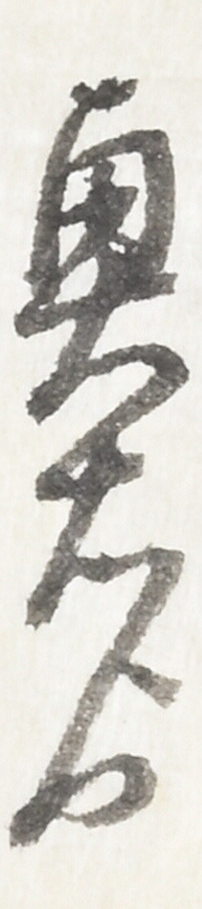奥右衛門
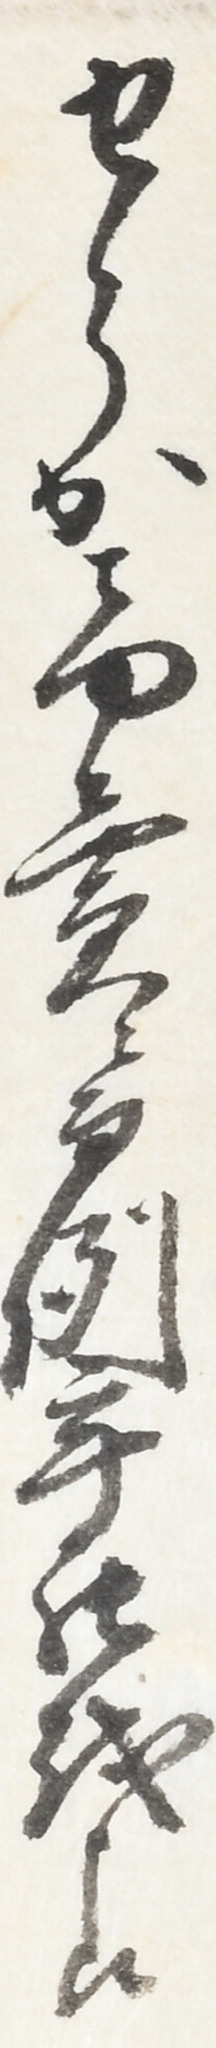せうか商売ニ而例年罷越申候
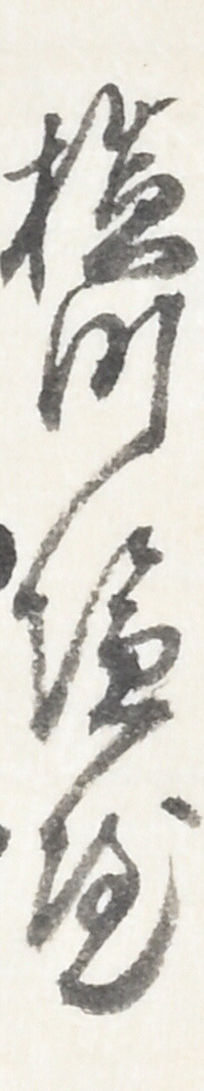横町塩屋
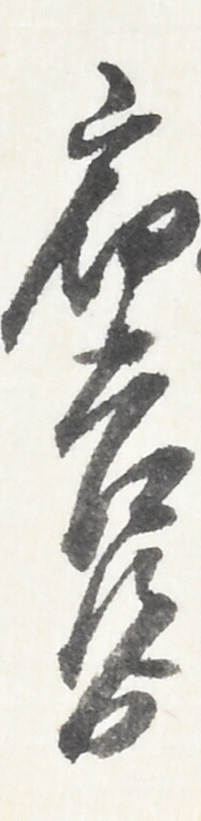宿吉左衛門
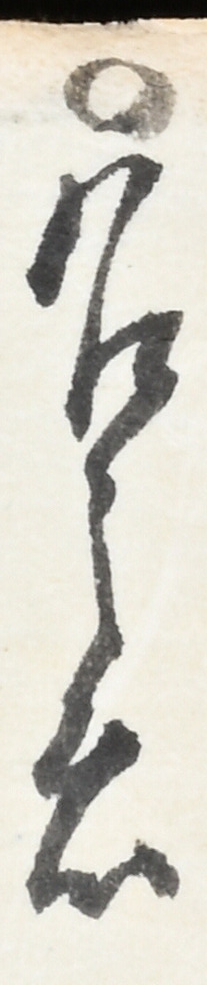〇右之者

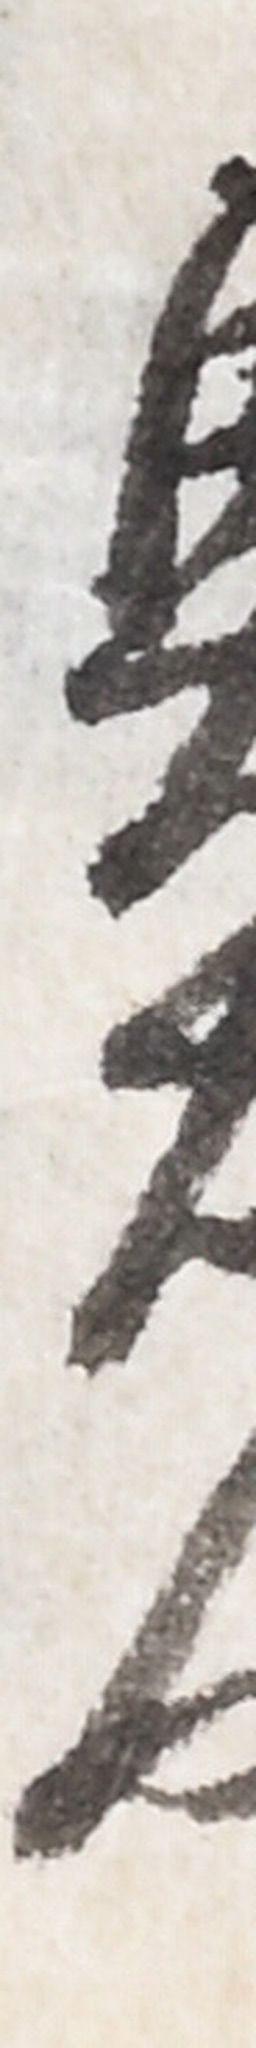理右衛門
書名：旅人泊控帳
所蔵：伊那市立高遠町図書館・合同会社AMANE
